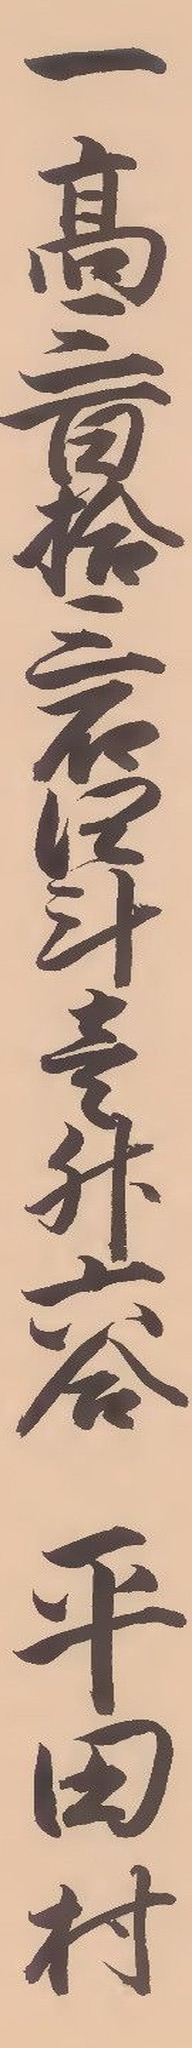一高三百拾三石四斗壱升六合平田村
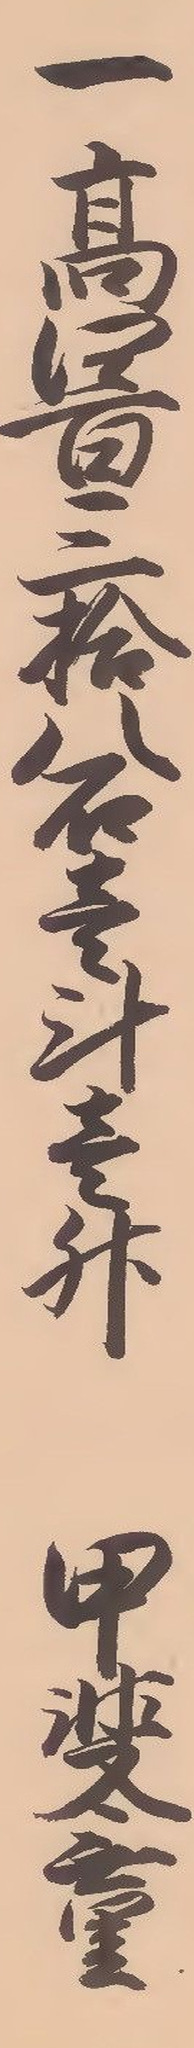一高四百三拾八石壱斗壱升甲斐無里
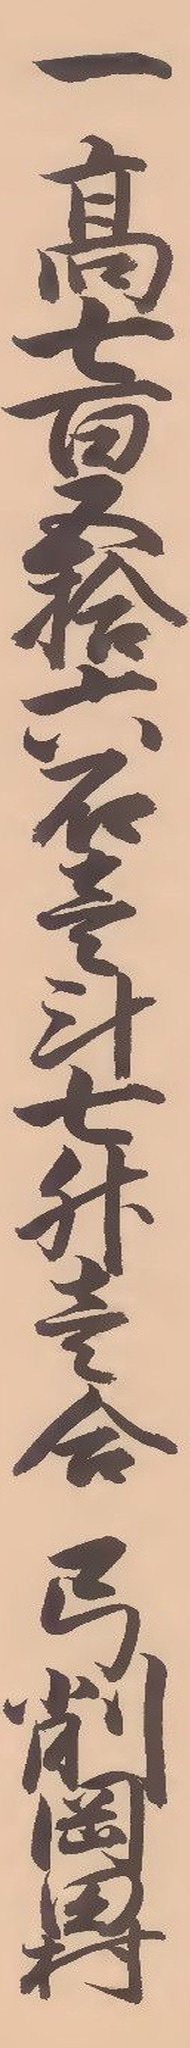一高七百五拾六石壱斗七升壱合弓削岡田村

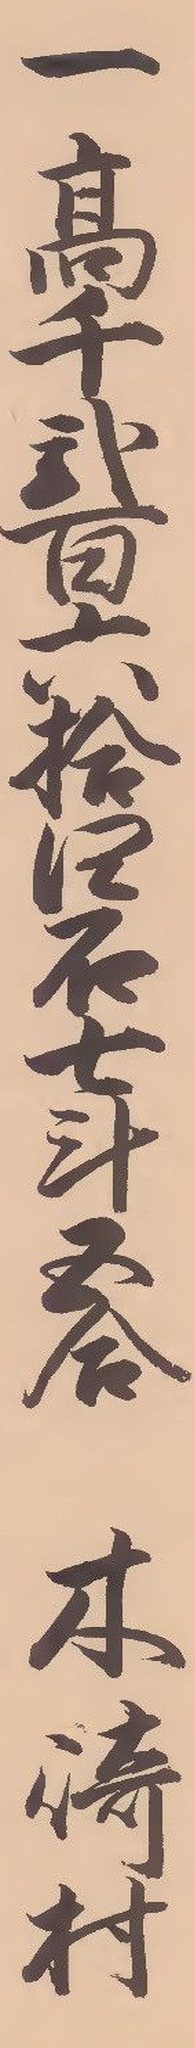一高千弐百六拾四石七斗五合木崎村
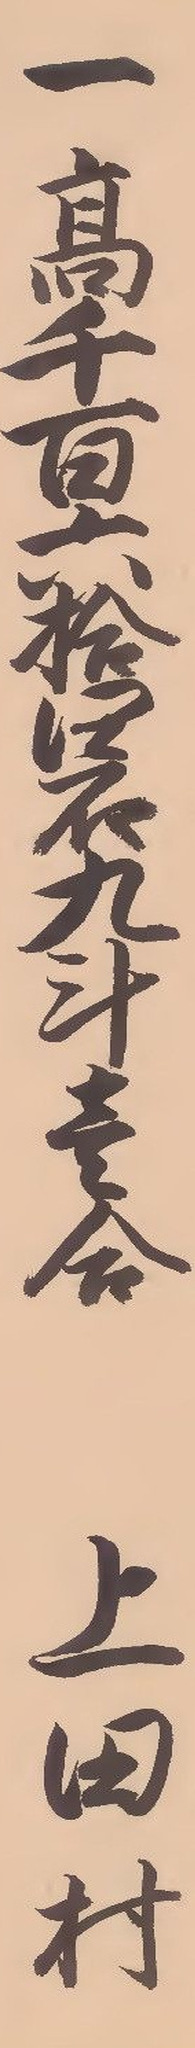一高千百六拾四石九斗壱合上田村
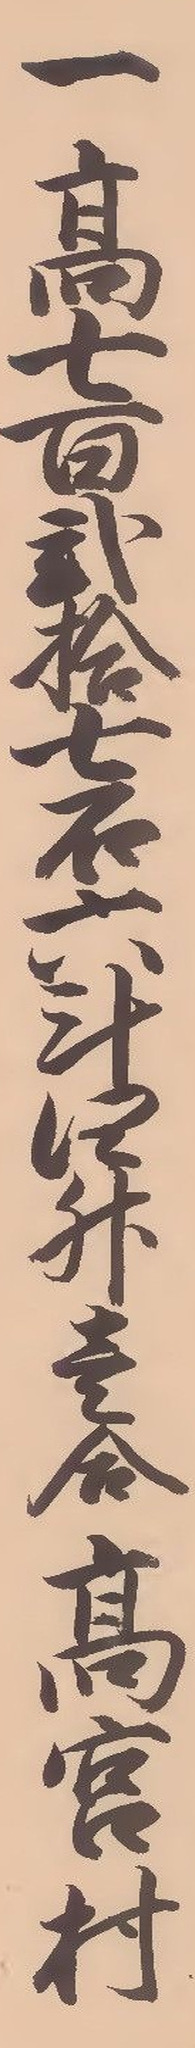一高七百弐拾七石六斗四升壱合高宮村
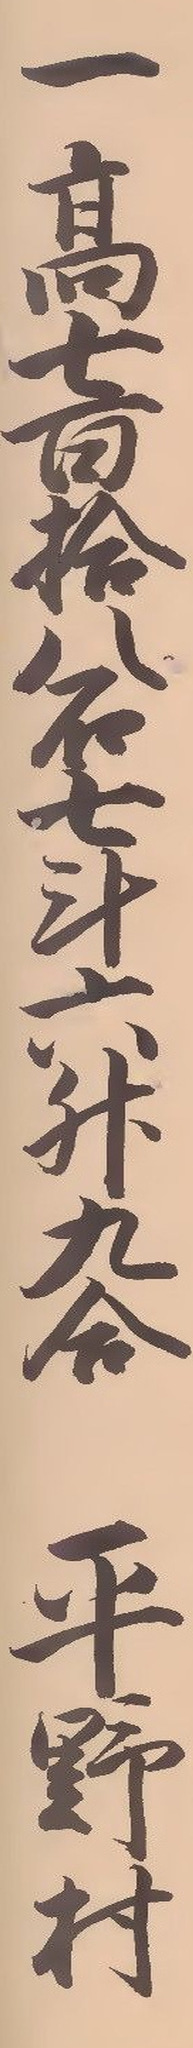一高七百拾八石七斗六升九合平野村
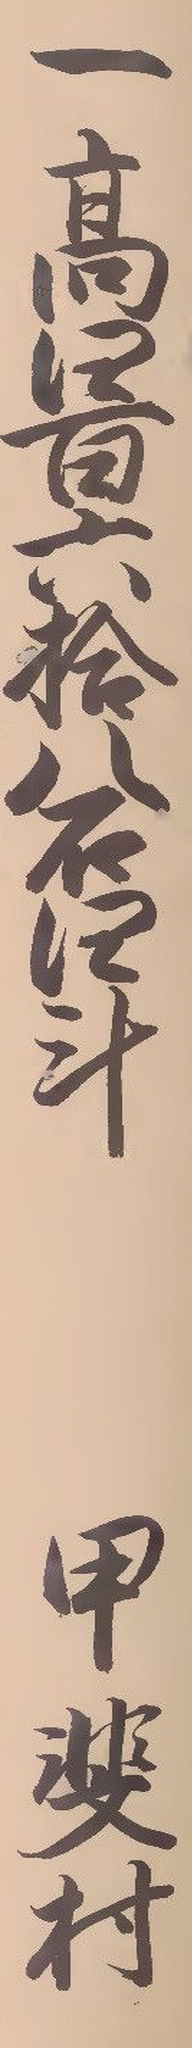一高四百六拾八石四斗甲斐村
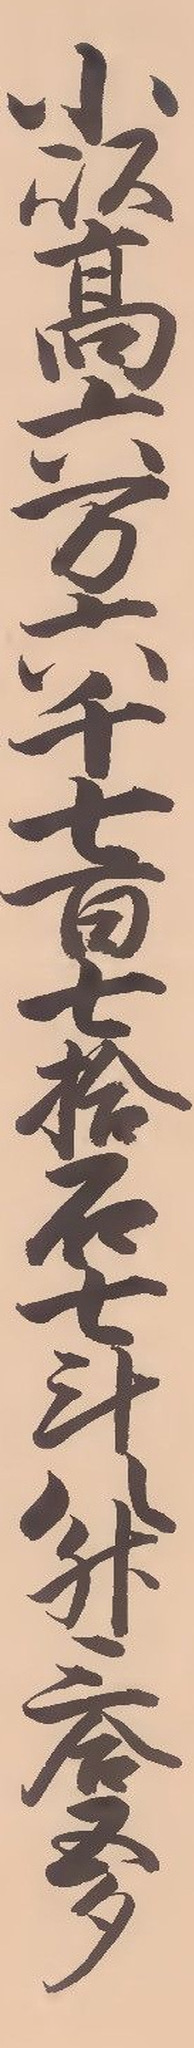小以高六万六千七百七拾石七斗八升三合五勺

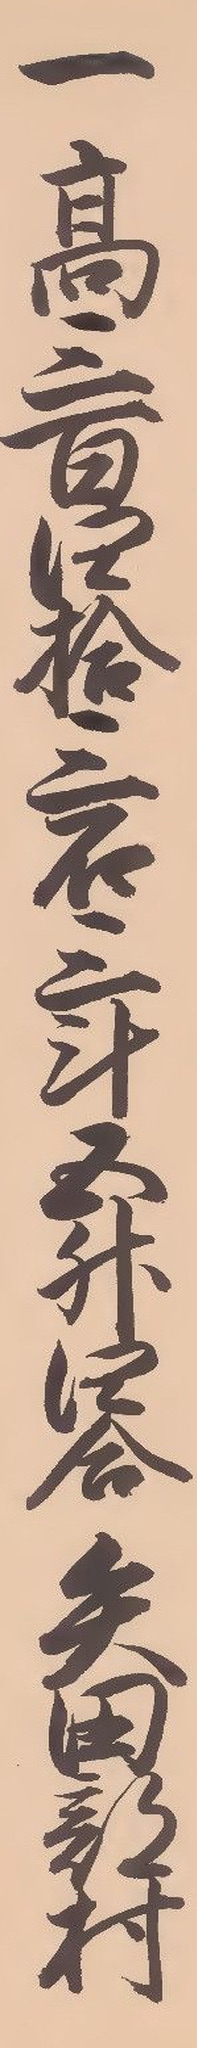一高三百四拾三石三斗五升四合矢田部村
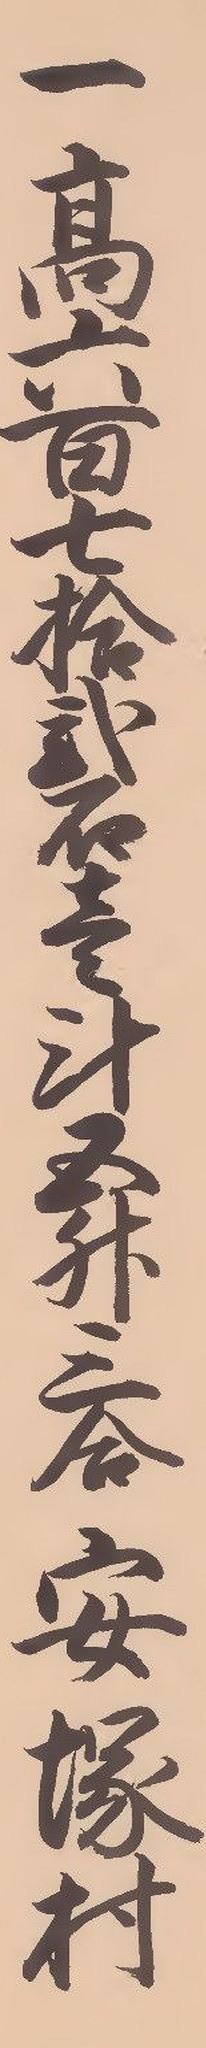一高六百七拾弐石壱斗五升三合安塚村
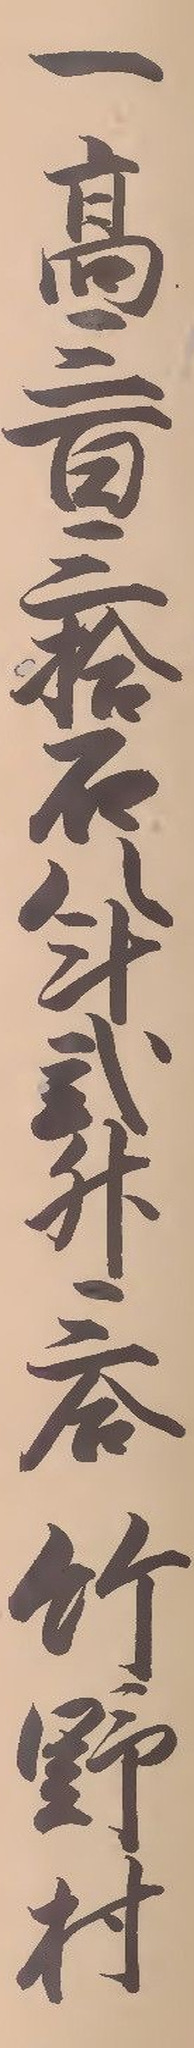一高三百三拾石八斗弐升三合竹野村
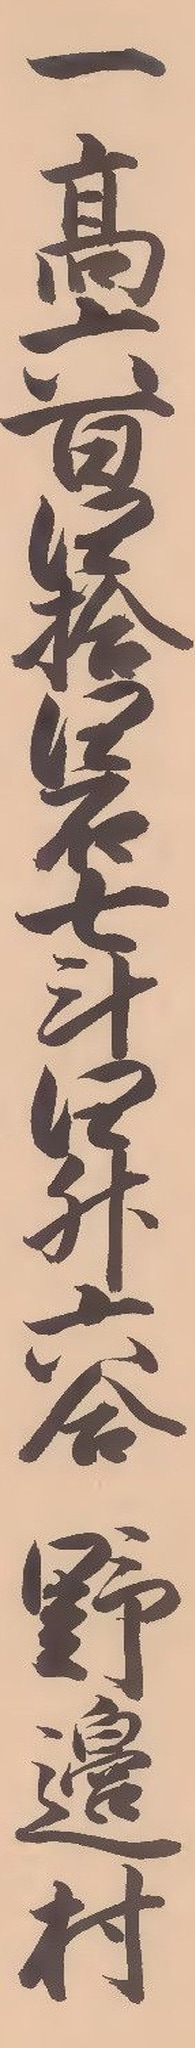一高六百四拾四石七斗四升六合野辺村
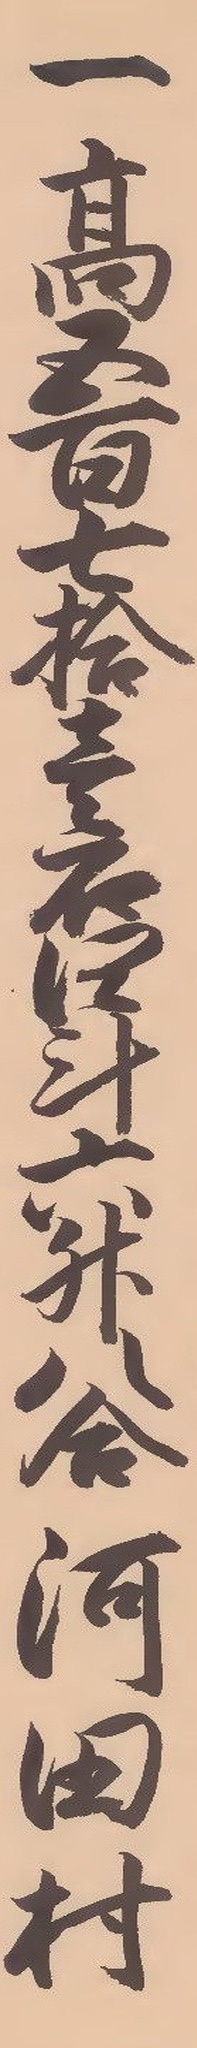一高五百七拾壱石四斗六升八合河田村
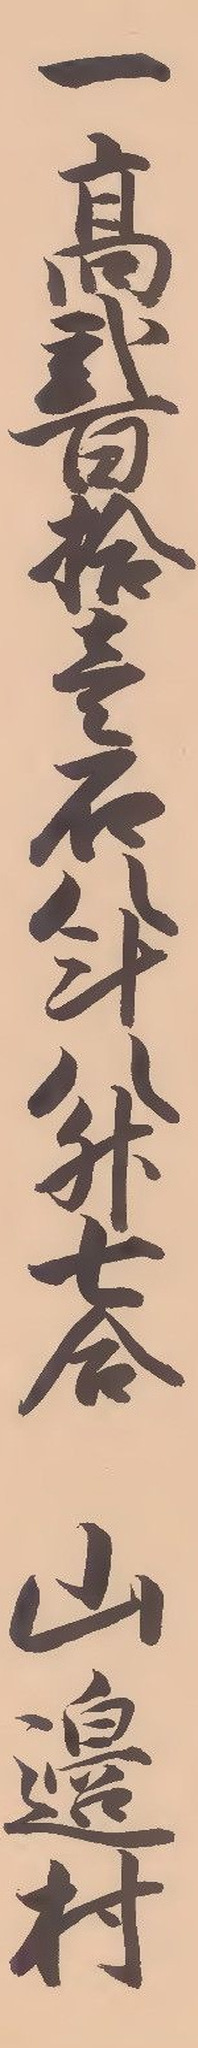一高弐百拾壱石八斗八升七合山辺村

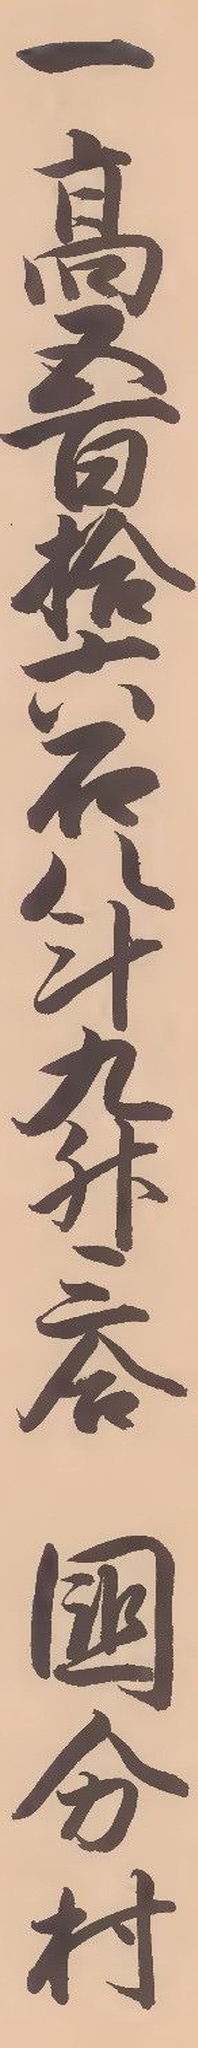一高五百拾六石八斗九升三合国分村
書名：伊勢国郷帳
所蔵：国立公文書館 National Archives of Japan
